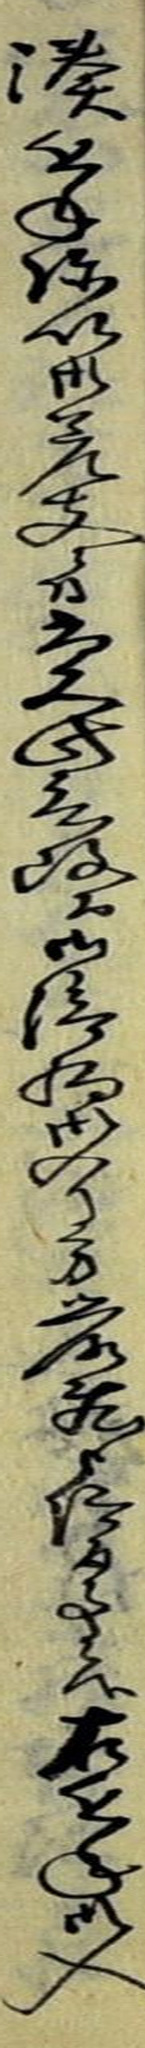湊近年弥以御差支ニ付尚又此度改而御倹約御〆り方厳敷被仰付事ニ候右近年御入
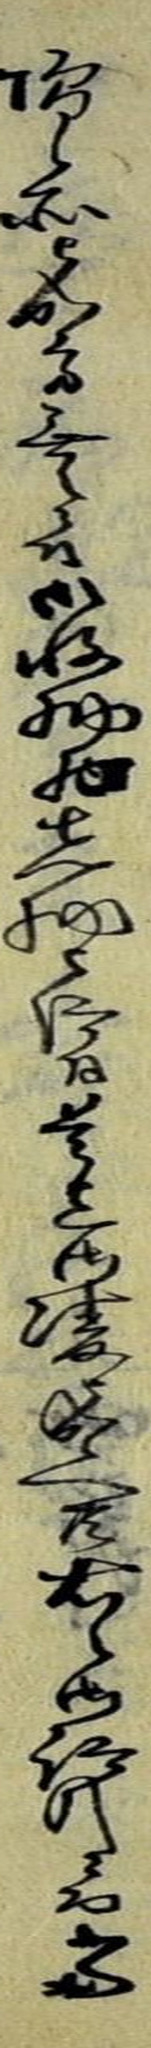増候所被成方無之ニ付御収納物先納被仰付是迄御凌被成候へ共右之御跡引ニ而当
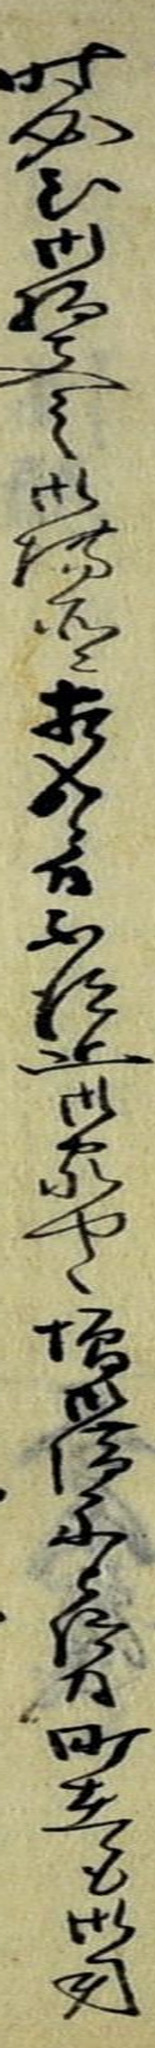時必至御指支之御場所ニ相成ニ付不得止御家中へ増御借米被仰付町在へも御用
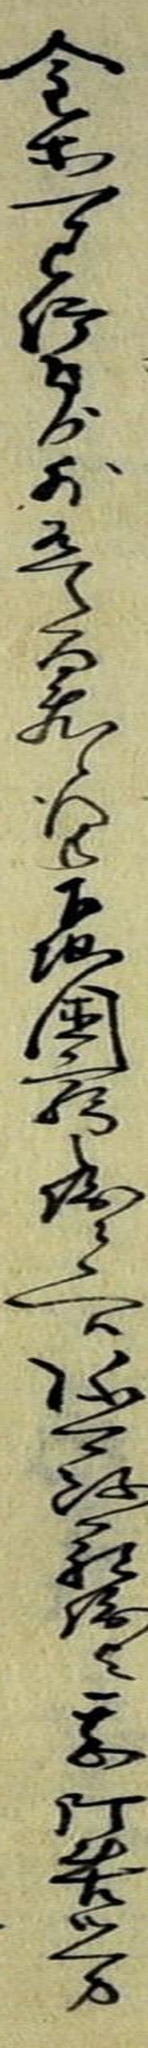金等可被仰付ゟ外有之間敷候得共下地困窮之儀ニ候ヘハ弥可致難儀与甚御苦労
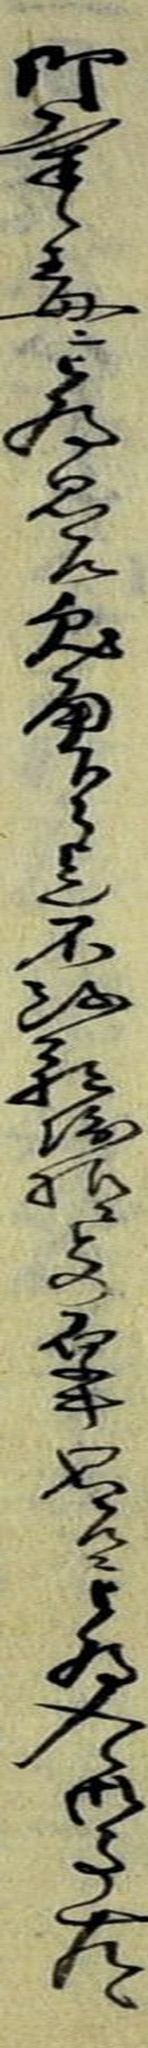御気之毒ニ被為思召兎角下々迄不致難儀様ニとの厚キ思召ニ被為入候御事左候
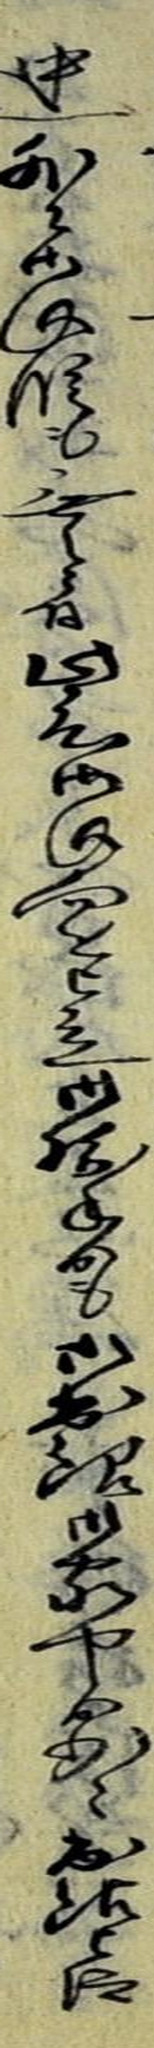迚外ニ御趣段も無之ニ付此度御趣向を被立御勝手ゟも御出銀御家中ゟ少々出銀被仰
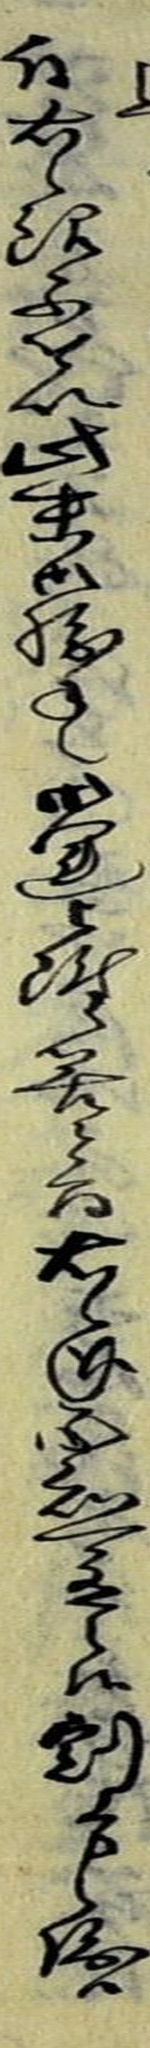付右之銀子を以此末御勝手之御運被付候筈ニ候間右之趣承知可有之候割方之儀ハ
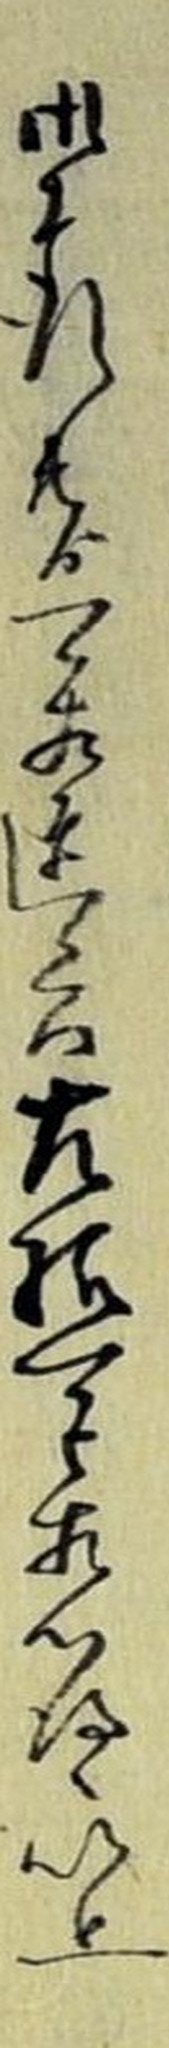御奉行共ゟ可相達候間左様可被相心得候以上
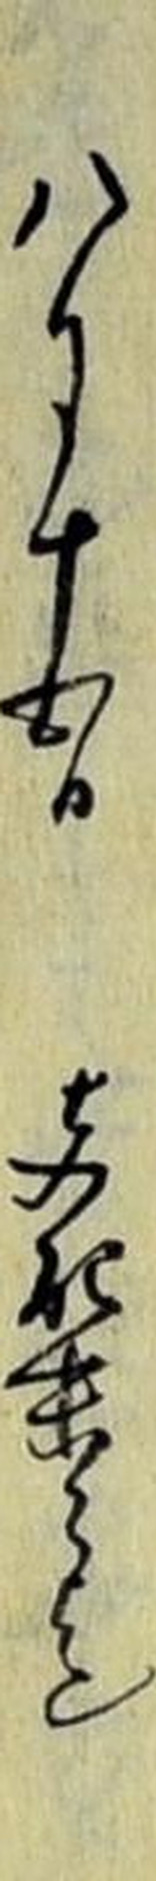八月十五日支配末々迄
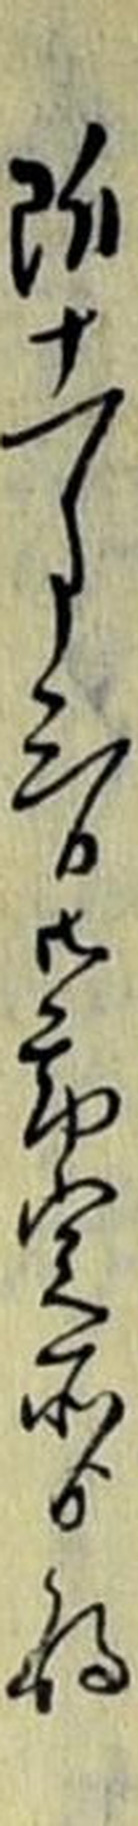附十一月三日御勘定所ゟ触
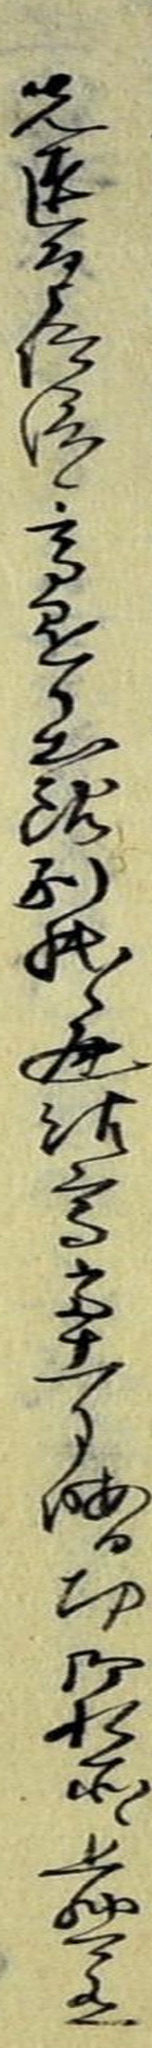先達而被仰渡候高懸り出銀別紙之通銀高当十一月晦日切御札所へ上納可有
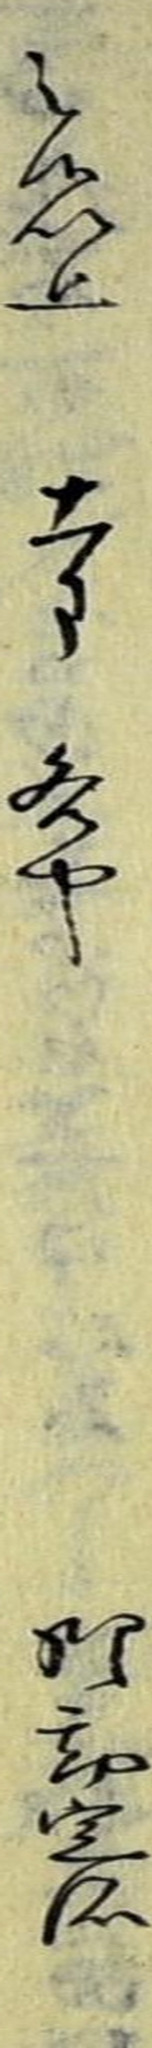之候以上十一月各中御勘定所
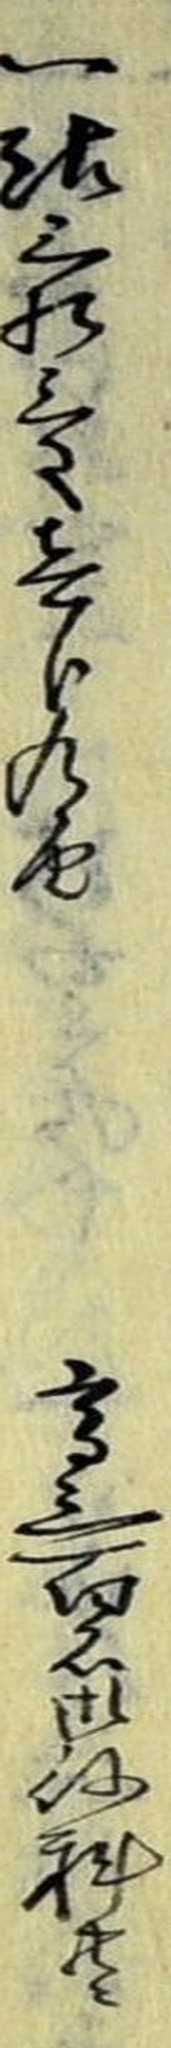一銀三拾三匁壱歩九厘高三百石御役料共ニ
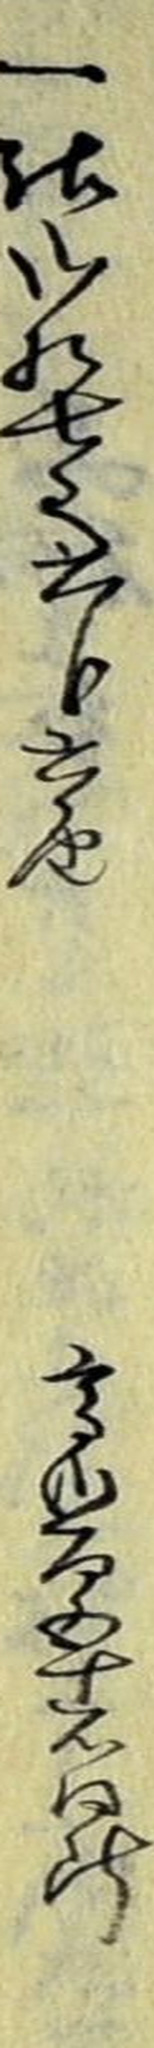一銀弐拾七匁六歩六厘高弐百五十石同断
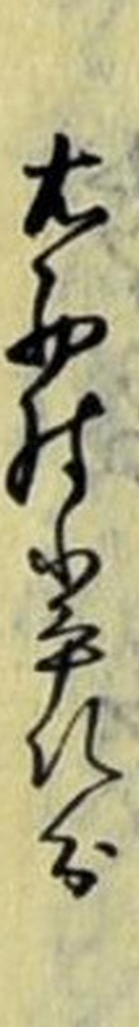右西村小平次分

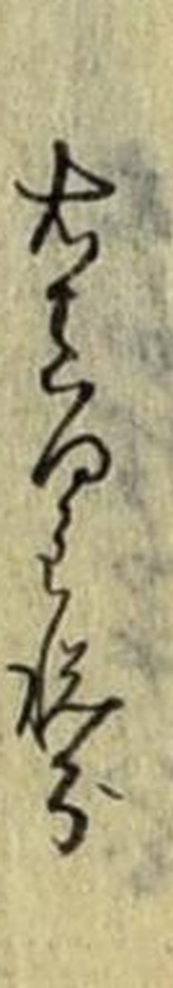右真田主税分
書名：命令之部 三
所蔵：福井県文書館 Fukui Prefectural Archives
